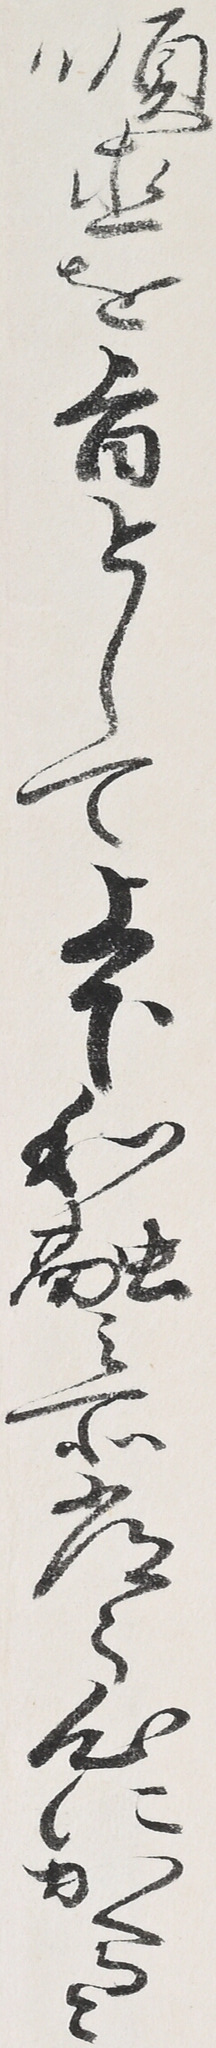順直を旨として上下和融之所常々心にかくると
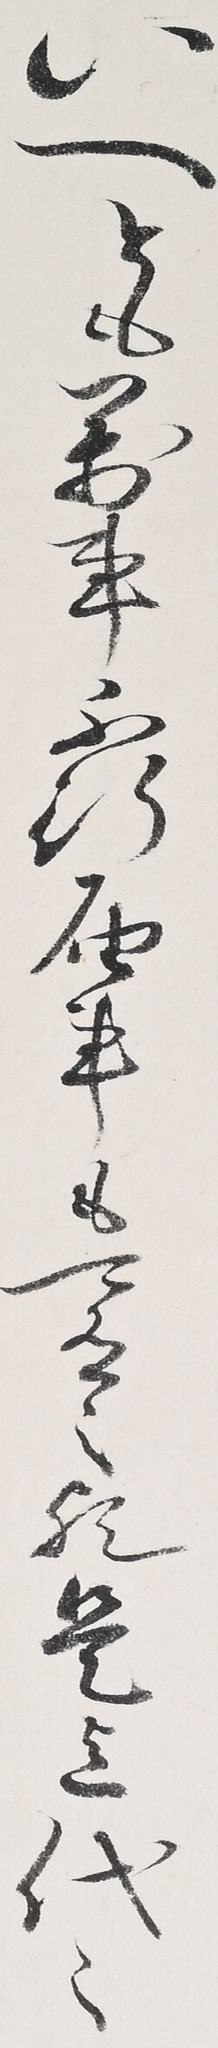いへとも万事不行届も可有之歟是上代々
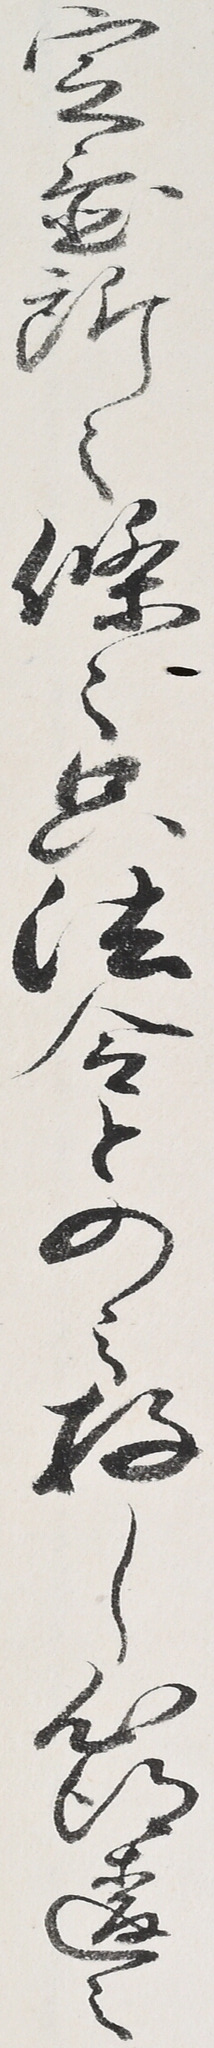定置所之條々只法令とのみ存し心得違之
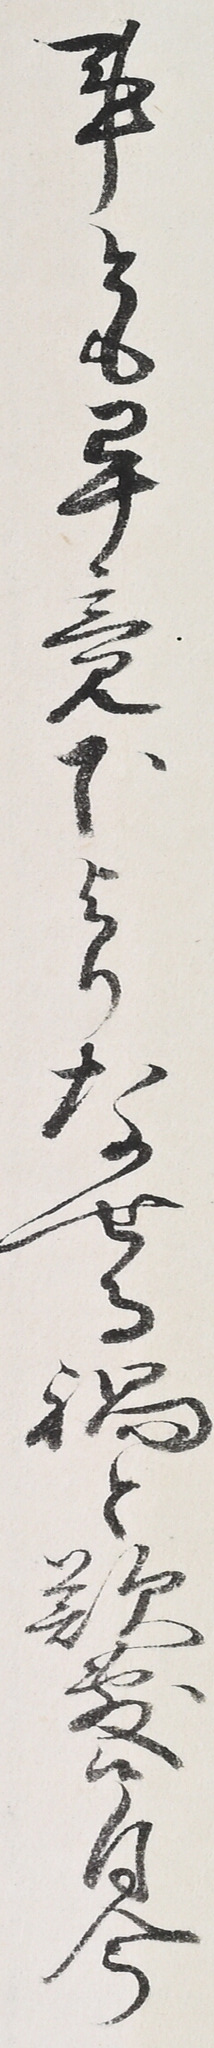事とも畢竟下よりなせる禍と歎敷候自今
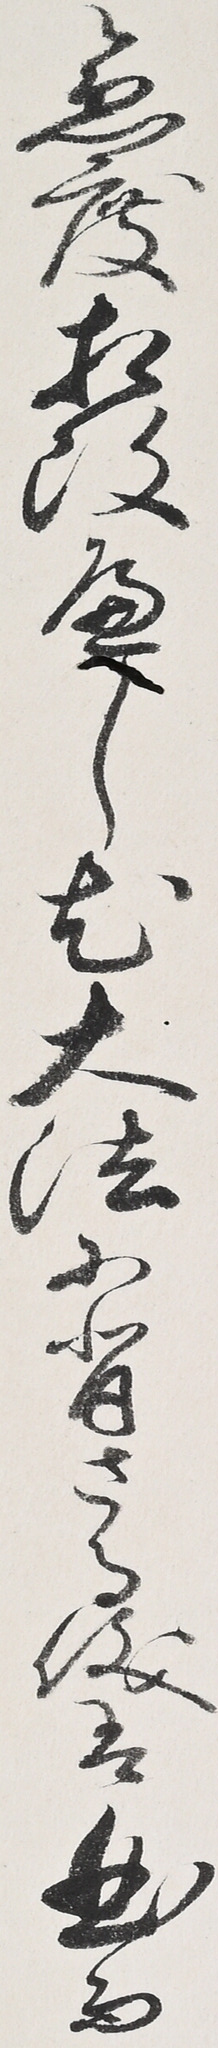急度相改へし尤大法に背さる儀は曲て
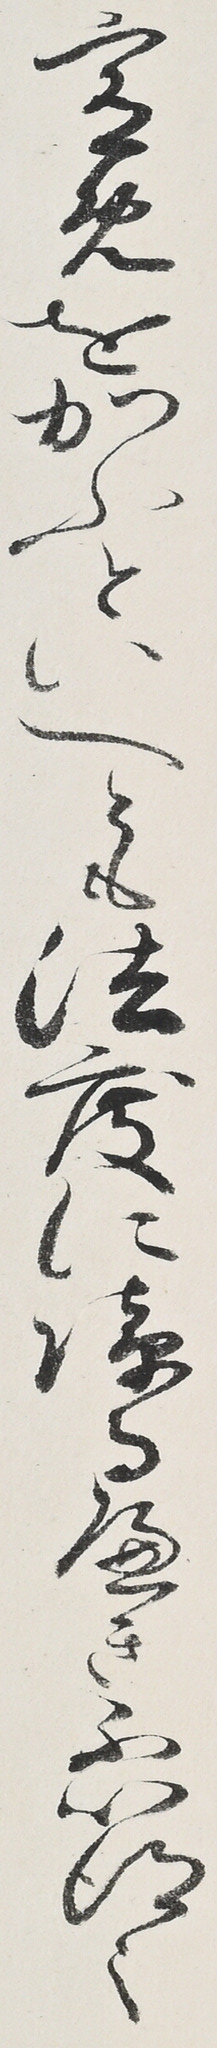定めを加ふといへとも法度に障るへき不心得之
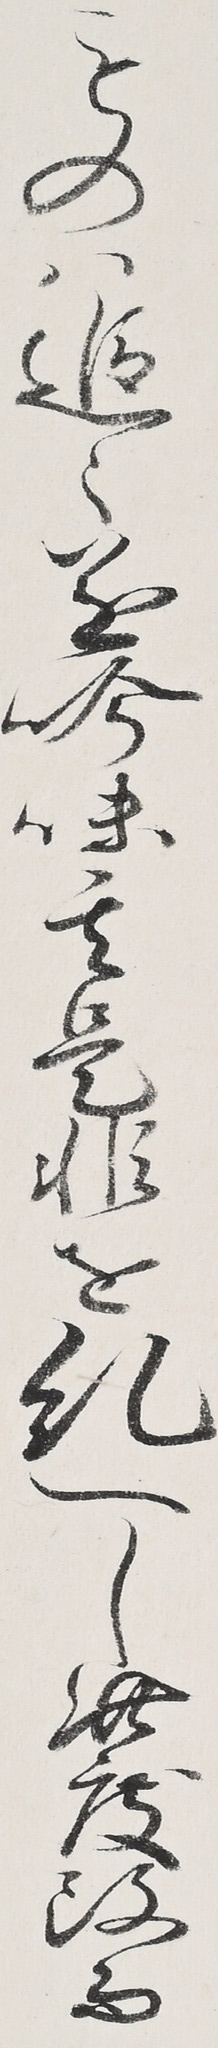ものは追々遂吟味其是非を糺へし此度改て
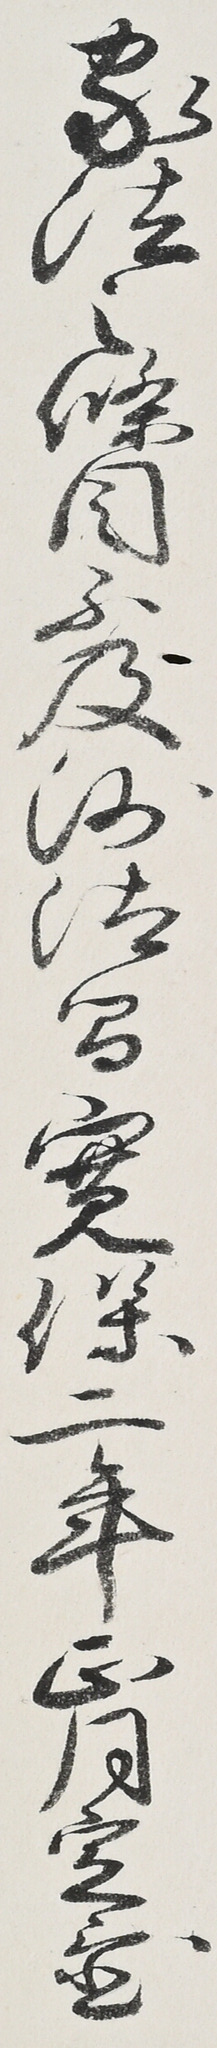家法之條目不及沙汰間寛保二年正月定置
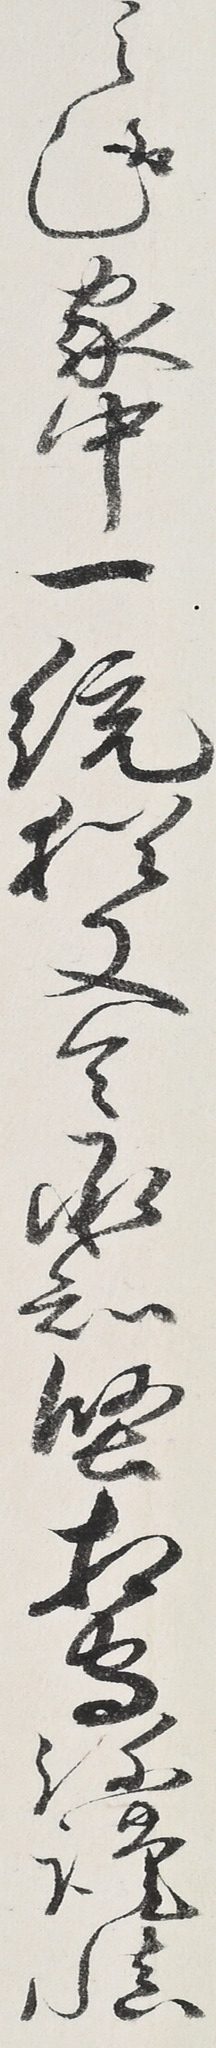之趣家中一統猶又令承知堅相守弥謹慎
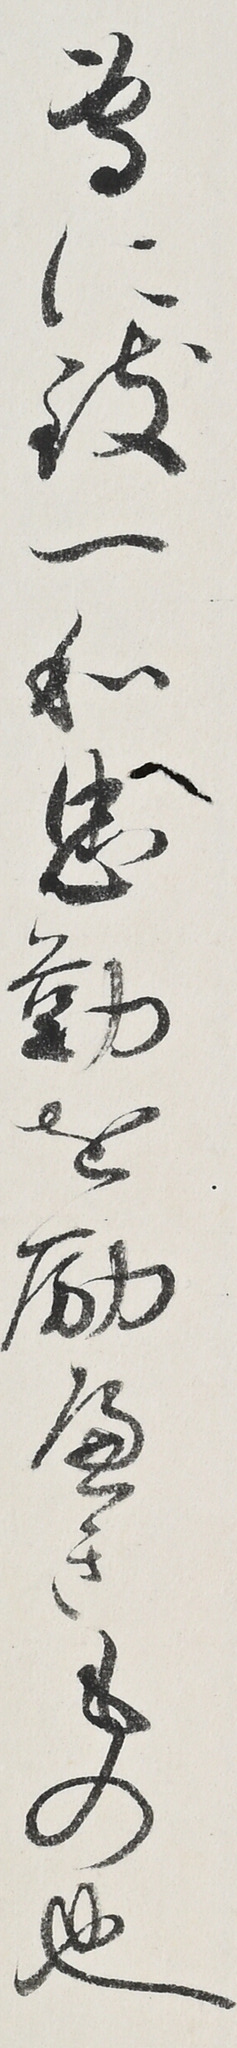専に致一和忠勤を励へきもの也
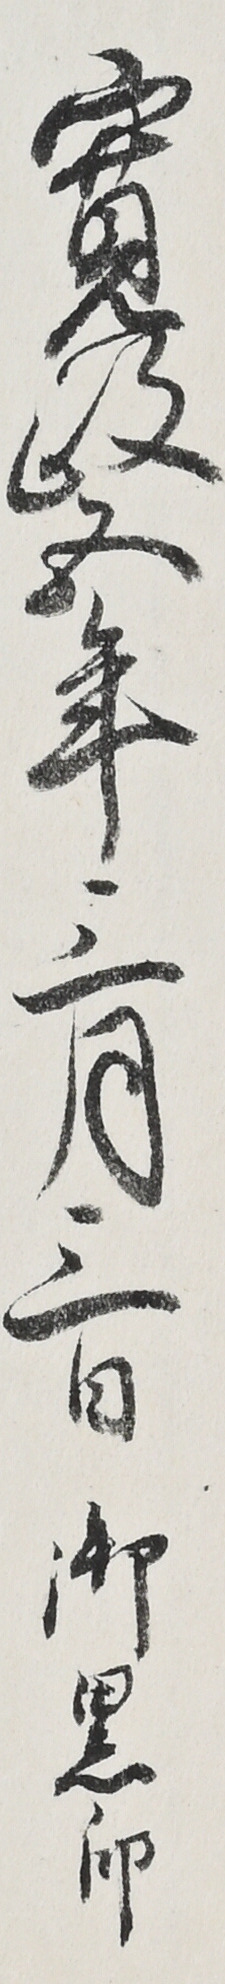寛政五年三月三日御黒印
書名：御添書〔写共二通一括〕
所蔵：伊那市立高遠町図書館・合同会社AMANE
